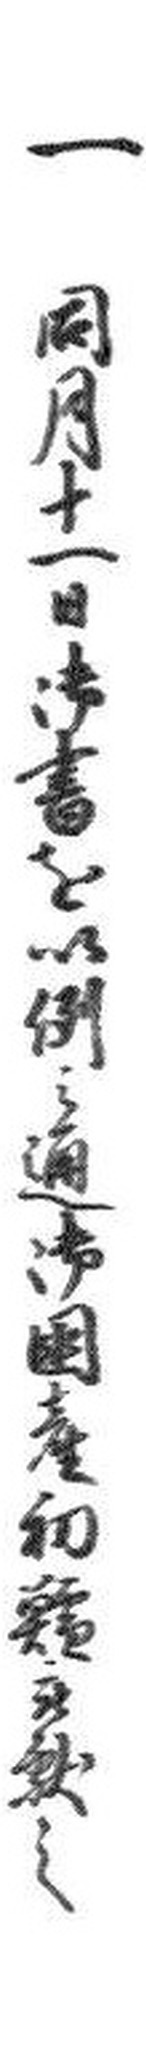一同月十一日御書を以例之通御国産初鱈被献之

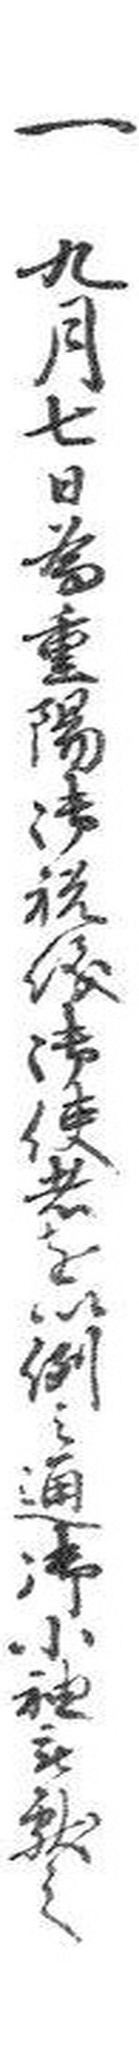一九月七日為重陽御祝儀御使者を以例之通御小袖被献之
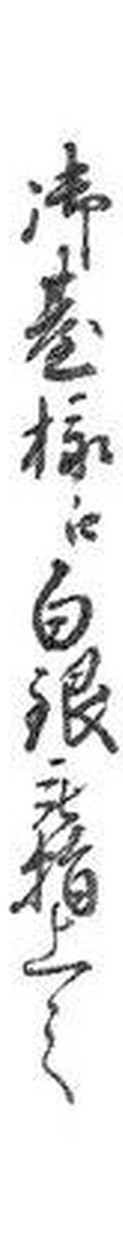御台様江白銀被指上之
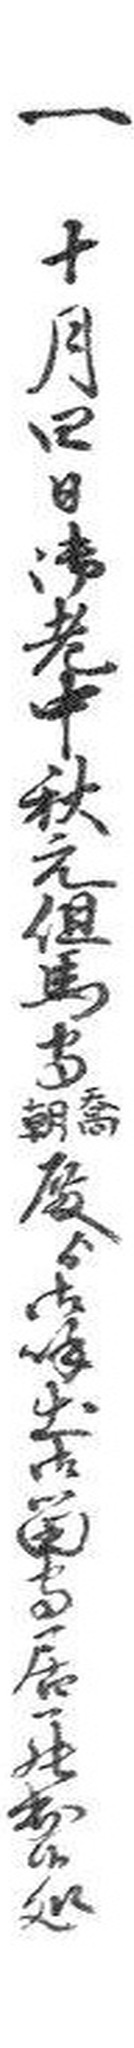一十月四日御老中秋元但馬守喬朝殿ゟ御呼出御留守居罷出候処
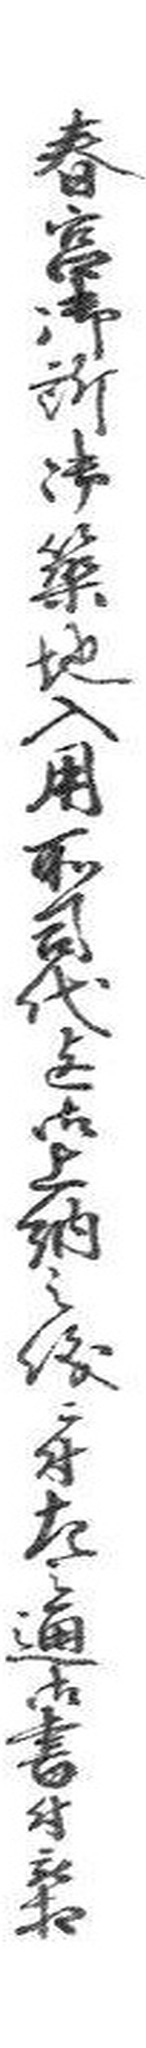春宮御所御築地入用所司代迄御上納之儀ニ付左之通御書付被相
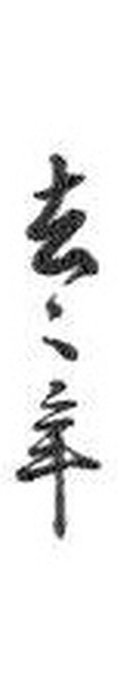去々年
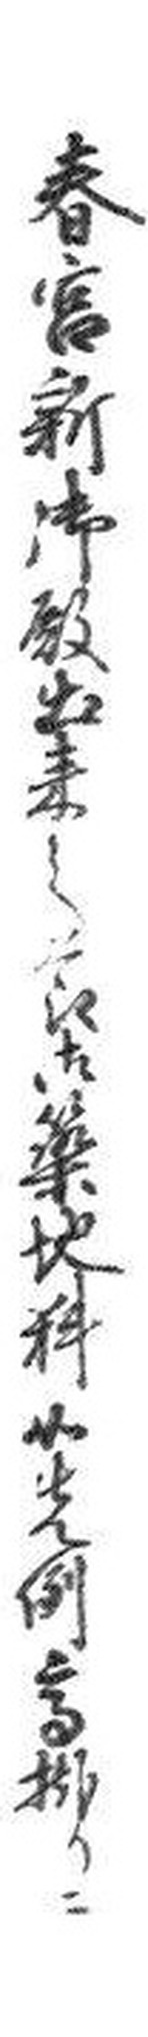春宮新御殿出来之節御築地料如先例高掛りニ
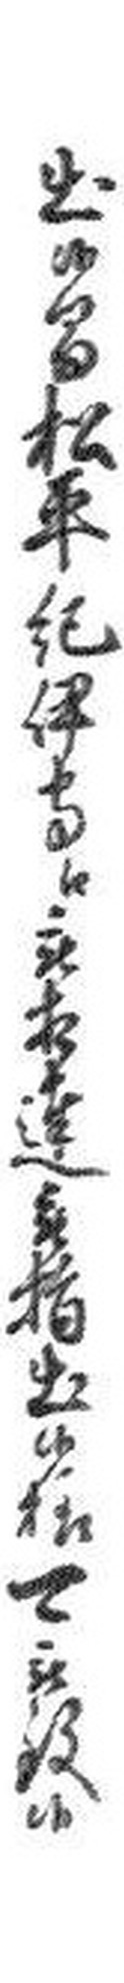出候間松平紀伊守江被相達被指出候様可被致候
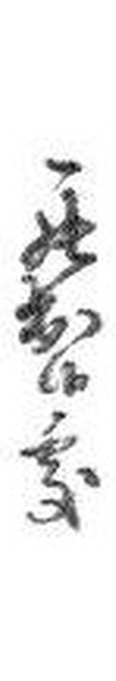罷出候処
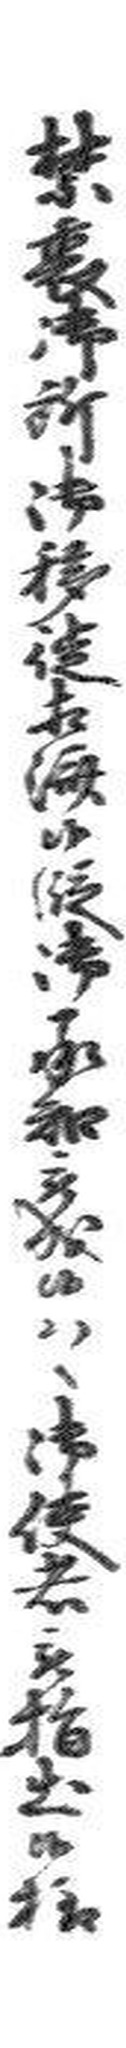禁裏御祈御移徙相済候段御承知被成候はゝ御使者被指出候様
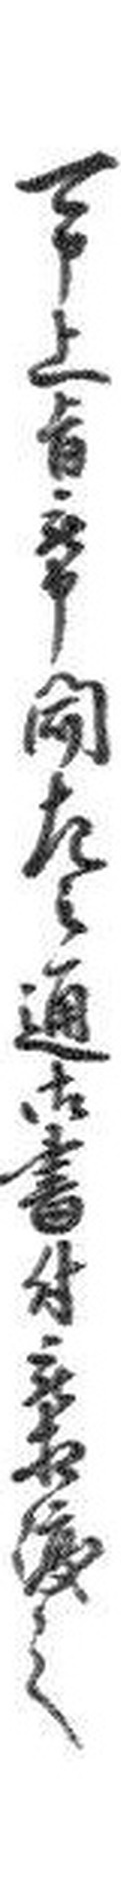可申上旨被申聞左之通御書付被相渡之
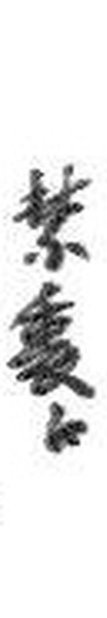禁裏江
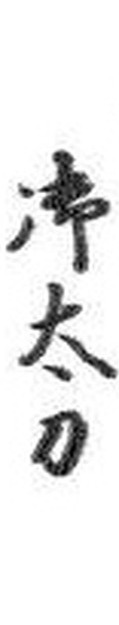御太刀
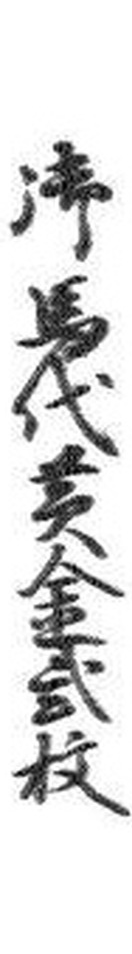御馬代黄金弐枚
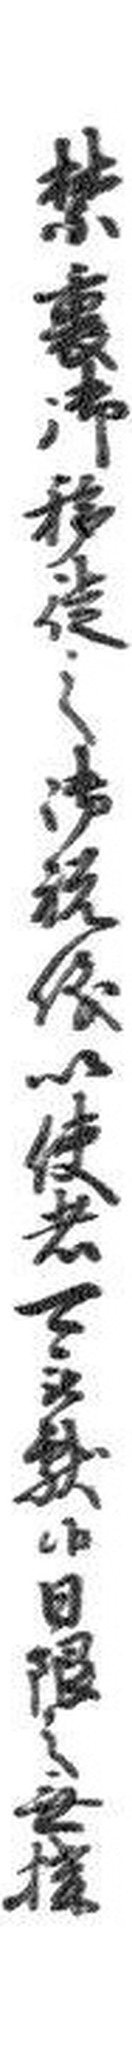禁裏御移徙之御祝儀以使者可被献候日限之無構

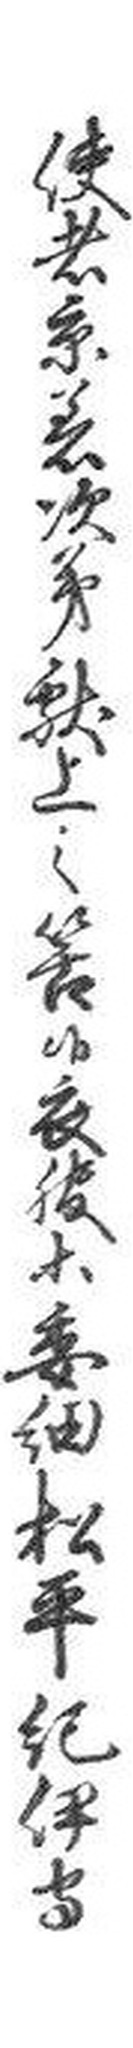使者京着次第献上之筈候衣服等委細松平紀伊守
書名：家譜 二十五 吉品公 従宝永六年到同七年
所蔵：福井県文書館 Fukui Prefectural Archives
